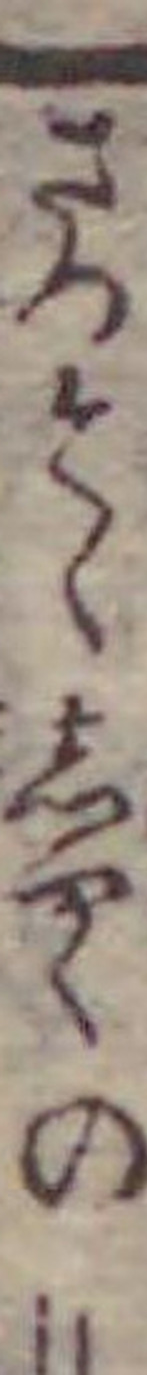さつそくしやくの
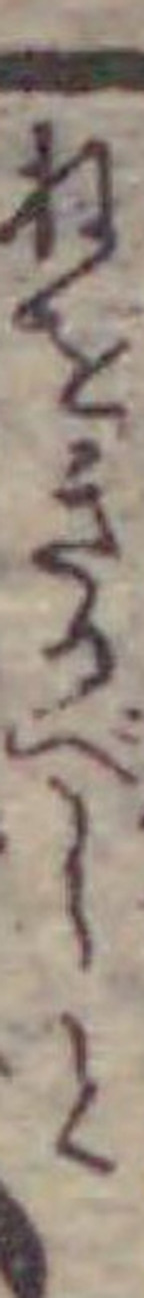ねをきるべしと
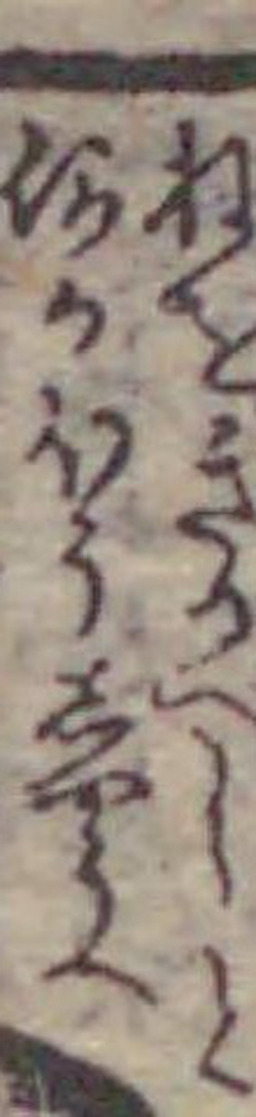何かほうしやうへ
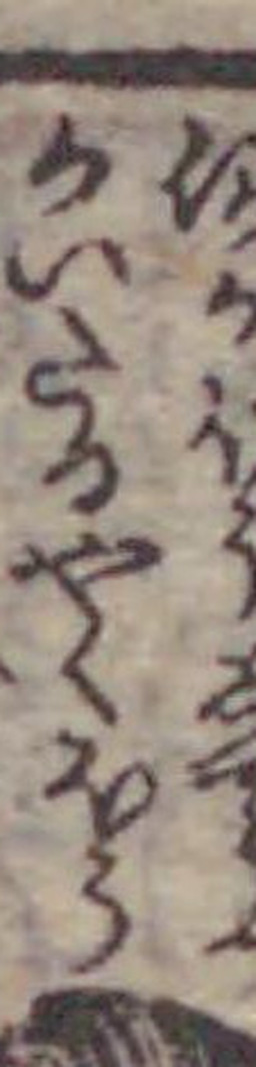かいたるやくほう
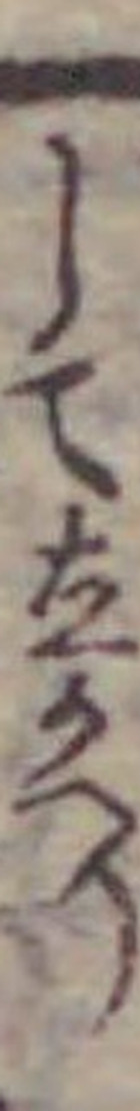して立ちかへり
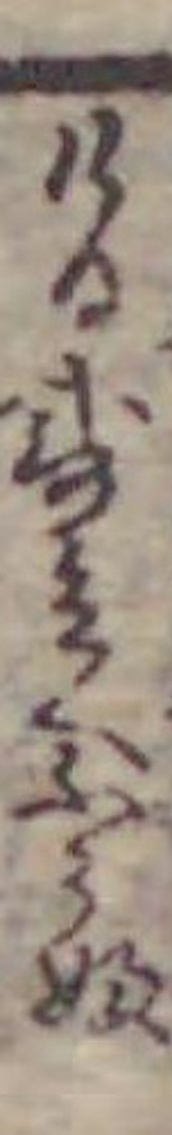ける寿兵へふう婦
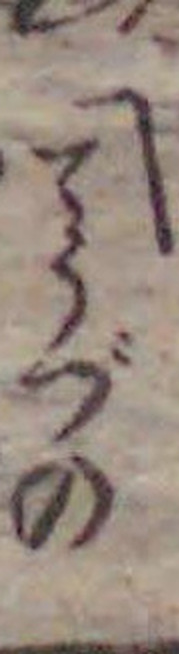〽てうづの
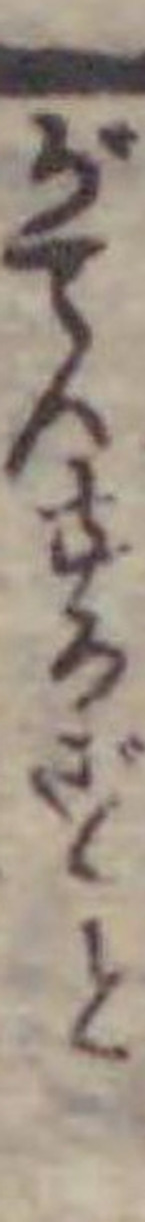がてんゆかずと
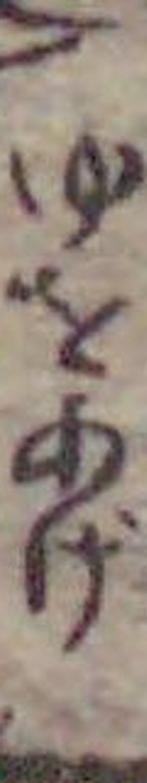ゆをあげ
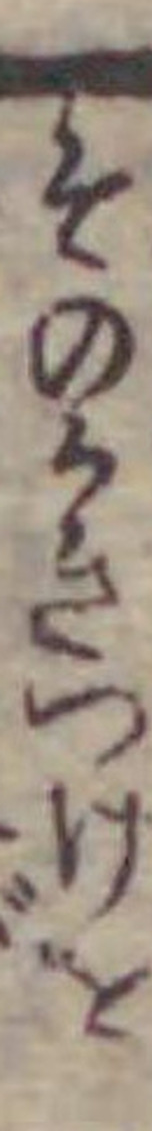そのかきつけを
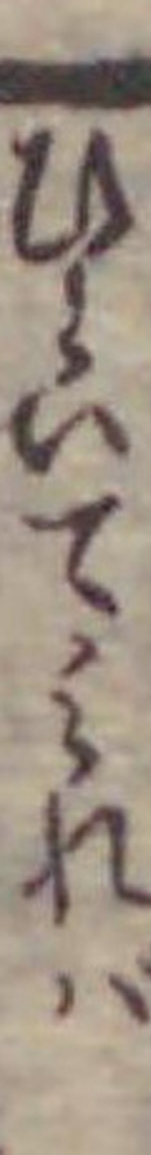ひらいてみれば
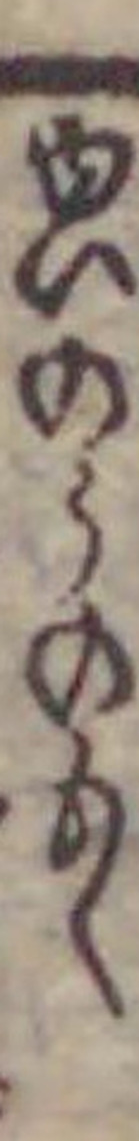ゆいのうのもく
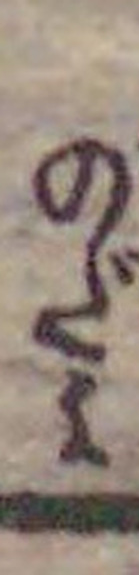のだよ
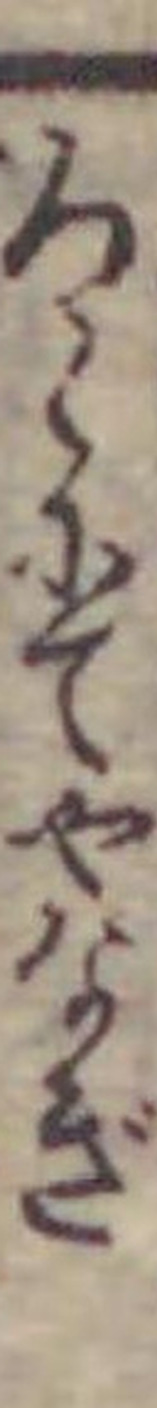ろくにてやなぎ
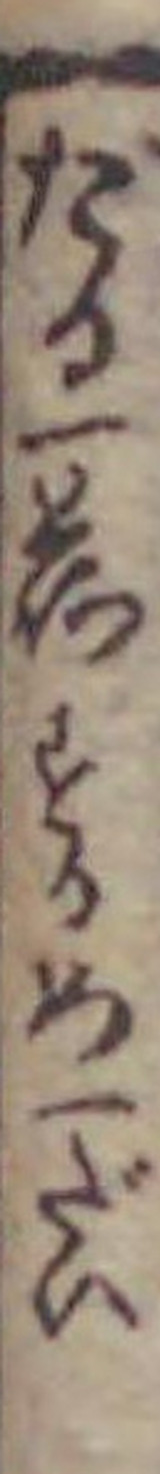だる一荷するめ一だい
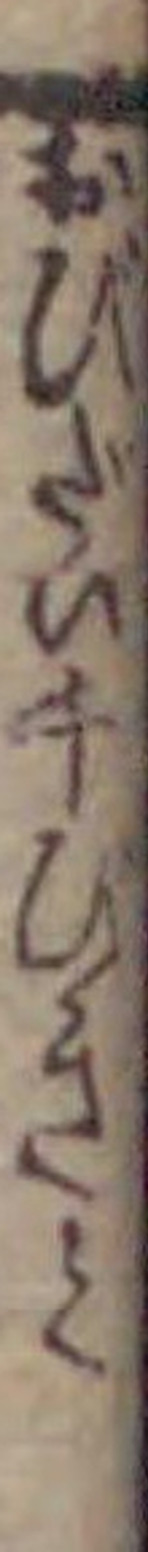おびだい千びきと
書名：鼻下長生薬 : 3巻
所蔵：国立国会図書館 National Diet Library, JAPAN
